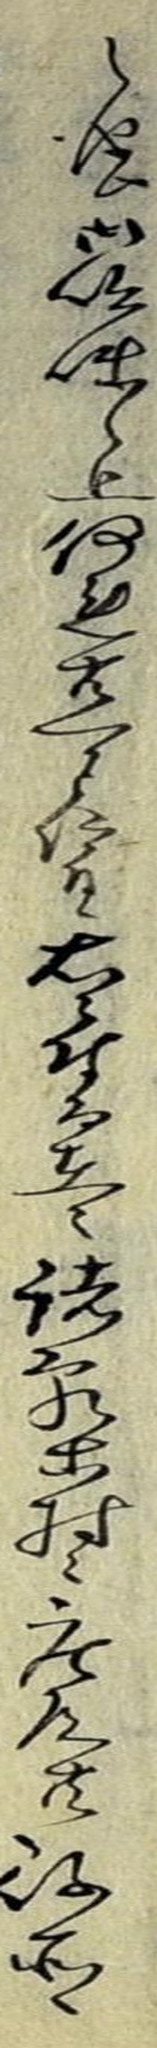之儀は御吟味之上何れ共可被仰付候右に付而在々諸願等村々庄屋共役所へ
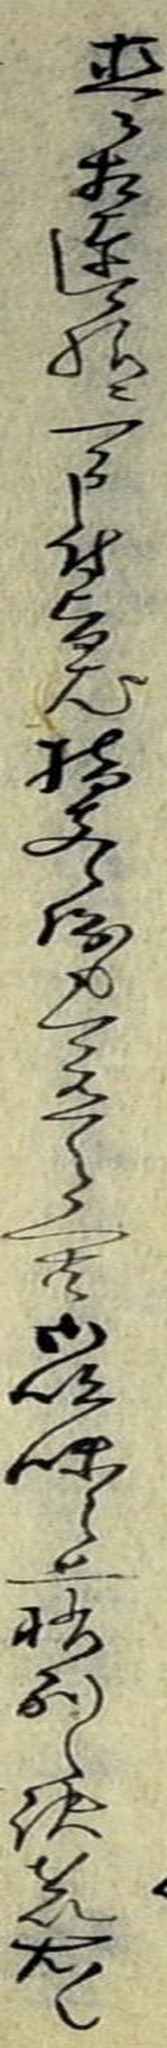直に相達候様に可申付旨尤指支之儀も可有之候へ共御吟味之上格別之訳を以右之
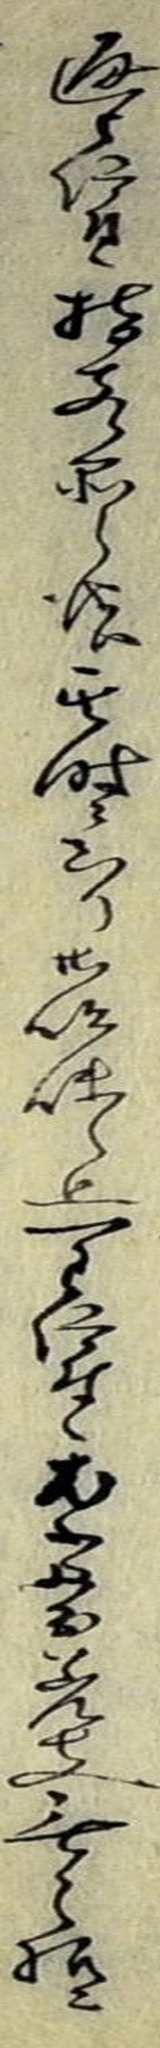通被仰付候指支候品之儀は其時に至り御吟味之上可被仰付候尤当分差支無之様に
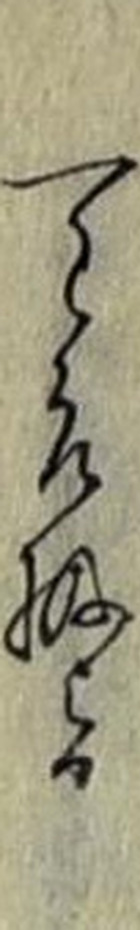可被取扱旨
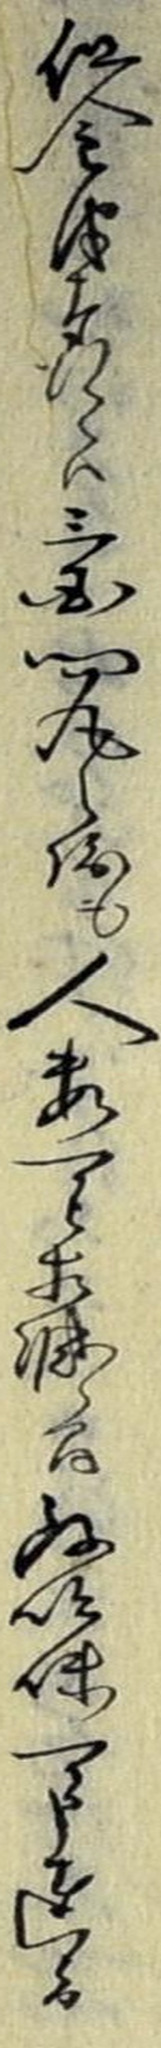但金津奉行へは三国問丸之儀も人数可被相減候間致吟味可申達旨
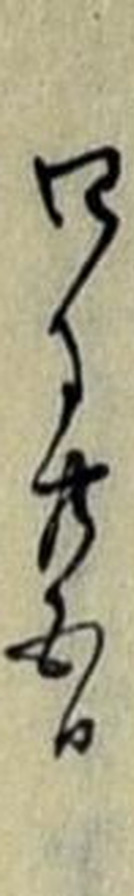四月廿五日
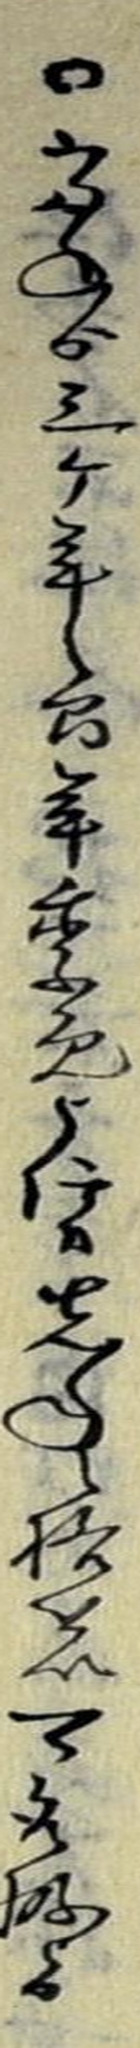〇当年ゟ三ヶ年之間年季免被仰付先年之格を以可取扱旨
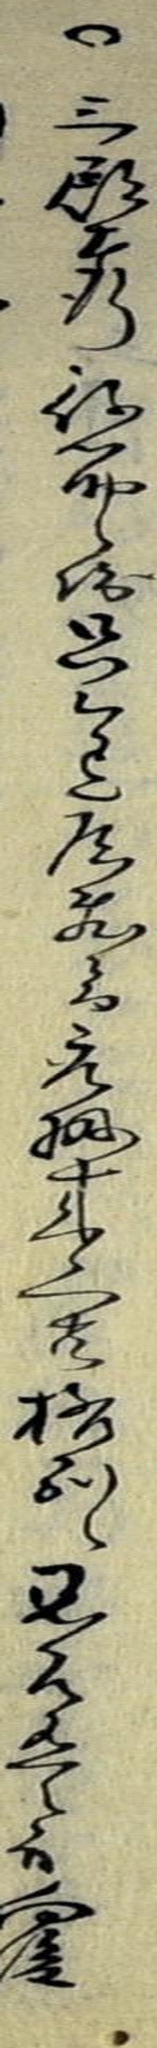〇三郡奉行役筋之儀只今迄屋敷に而取扱来候へ共格別之思召有之に付向後
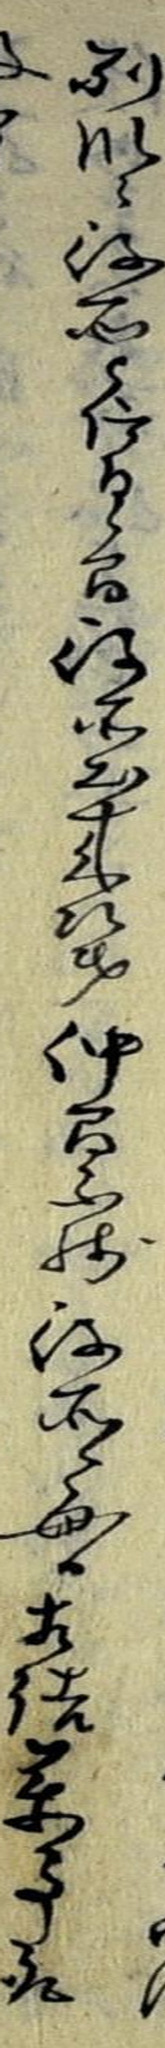別段に役所被仰付候間役所出来次第仲間不残役所へ毎日相詰万事取
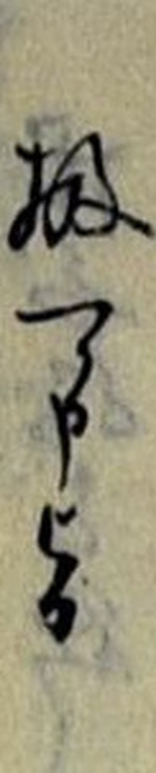扱可申旨
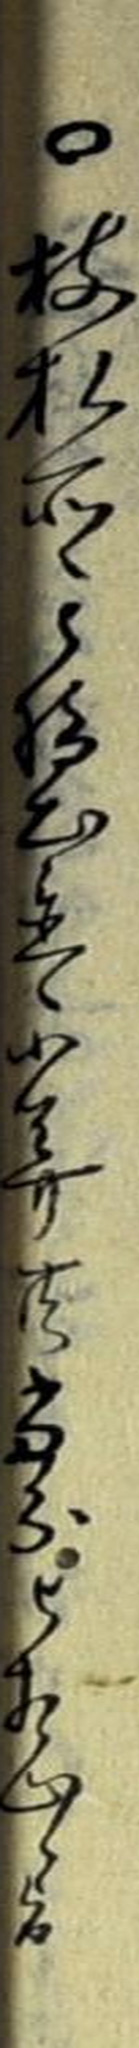〇枝札所へ被指出置候小算共当分被相止候旨
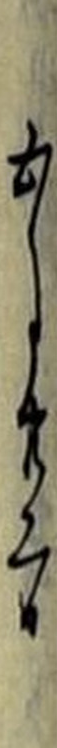五月廿二日
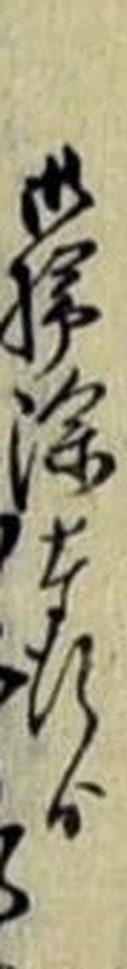御掃除奉行ゟ
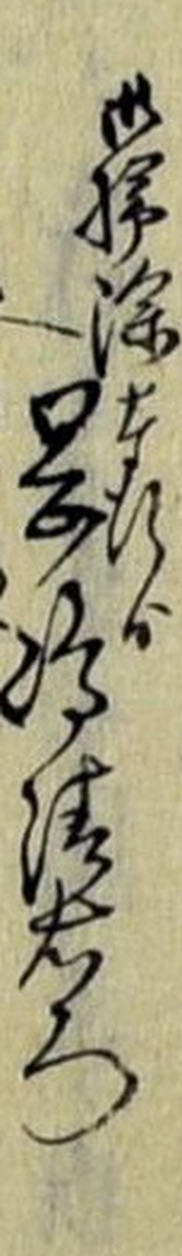岡嶋清右衛門
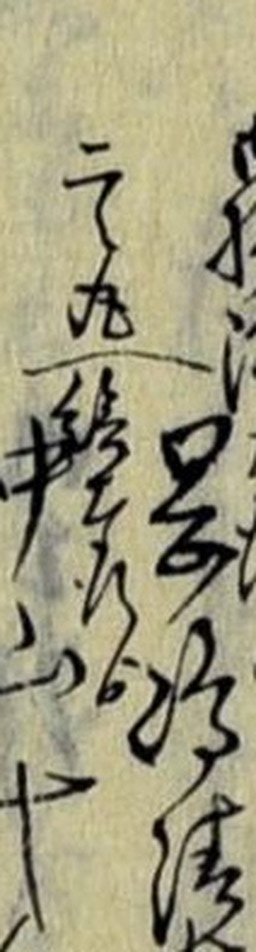四月廿五日
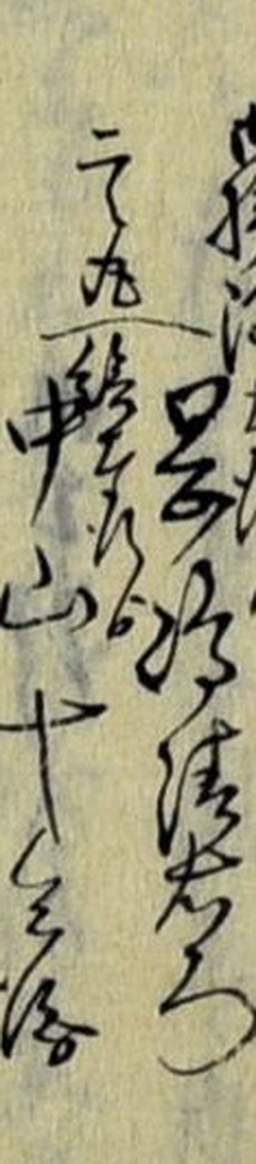中山十兵衛
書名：命令之部 二
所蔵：福井県文書館 Fukui Prefectural Archives
